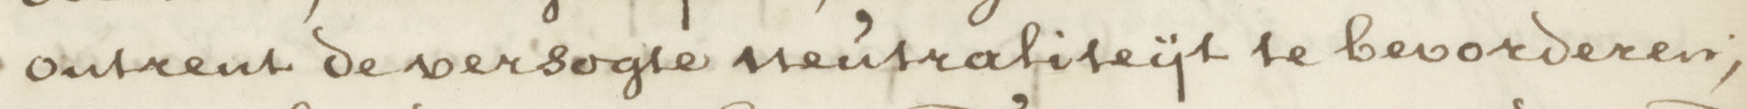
ontrent de versogte neutraliteijt te bevorderen,
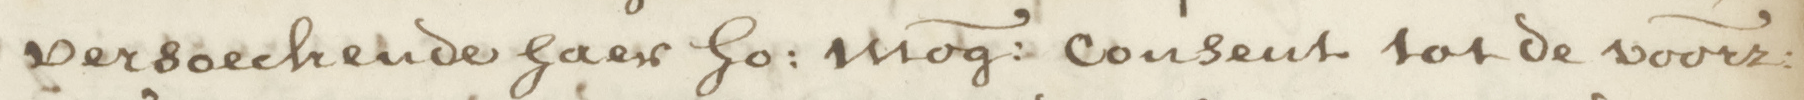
versoeckende haer Ho:Mog: consent tot de voors
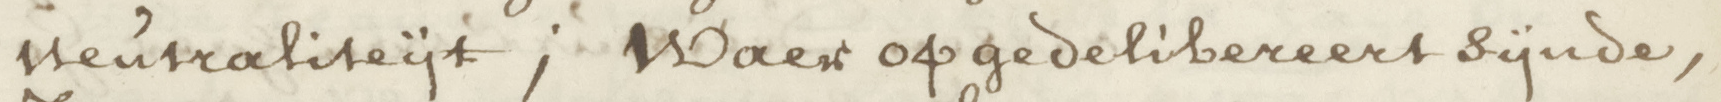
neutraliteijt; Waer op gedelibereert sijnde,
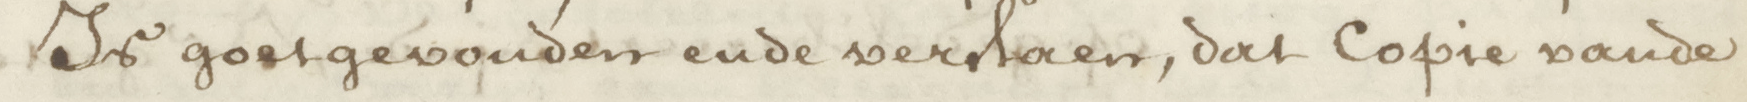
Is goetgevonden ende verstaen, dat copie vande
